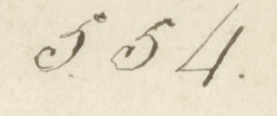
554.
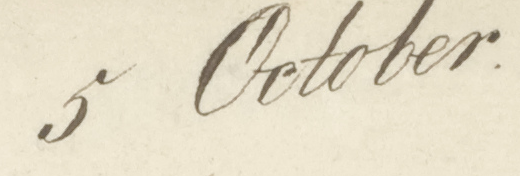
5 October.
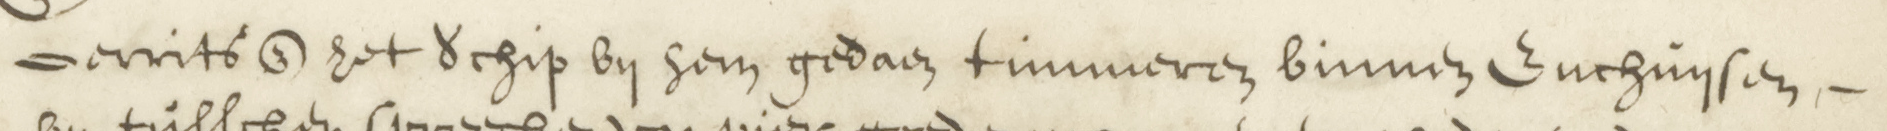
Gerritsz het Schip bij hem gedaen timmeren binnen Enchuysen —
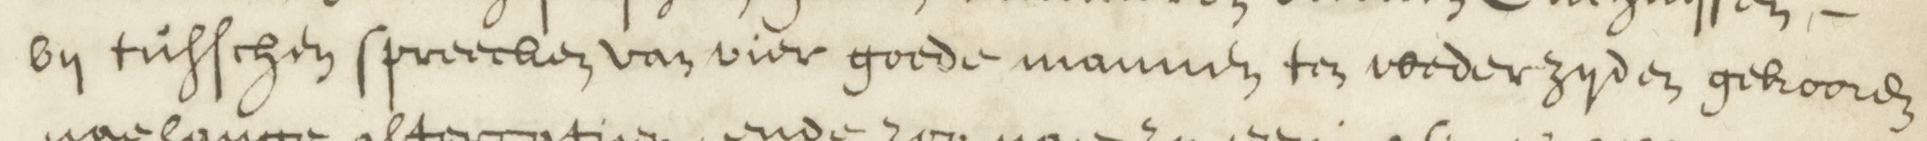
by tusschen spreecken van vier goede mannen ten wederzyden gehooren
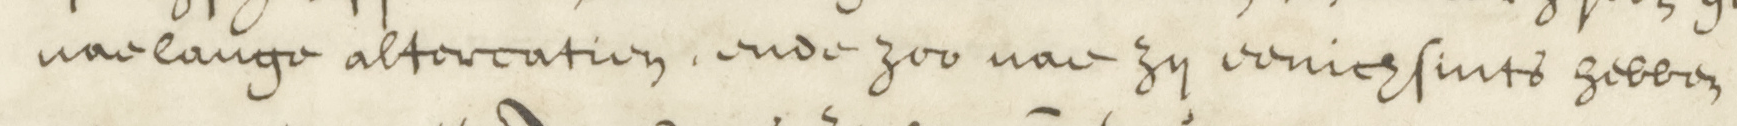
naelange altercatien, ende zoo nae zy eenichsints hebben
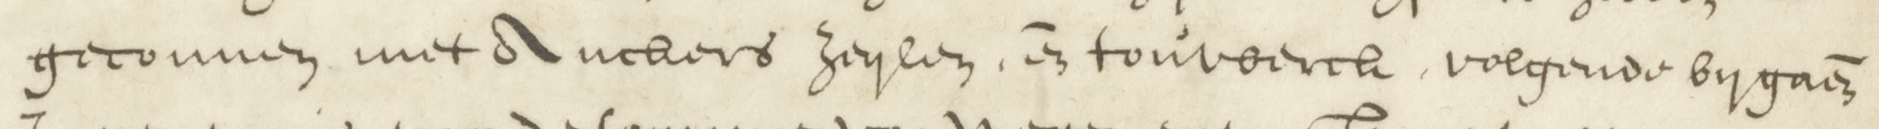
geconnen met Anckers zeylen, en touwerck, volgende bygaen
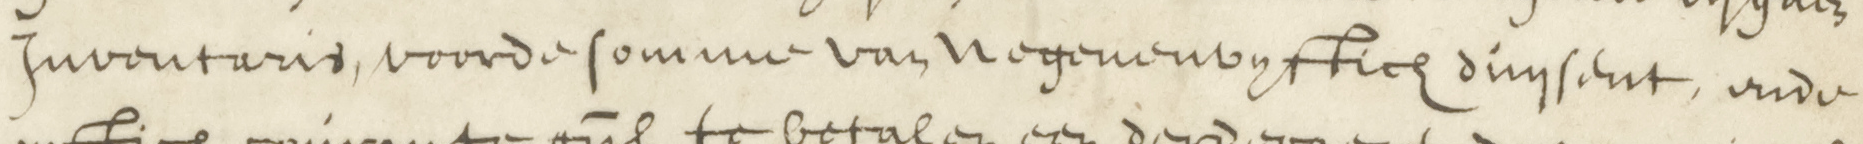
Inventaris, voorde somme van Negenenvyftich duysent, ende
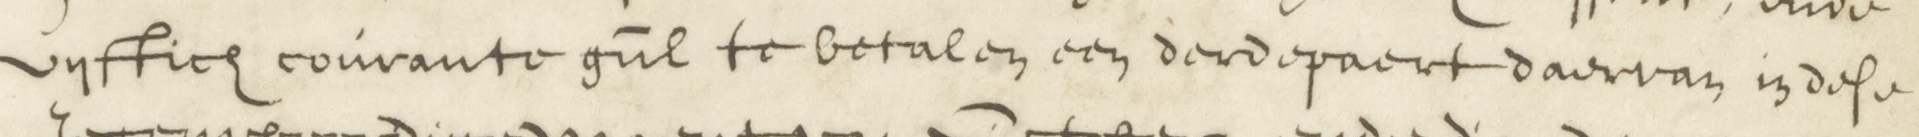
vyftich courante gul te betalen een derdepaert daervan in dese
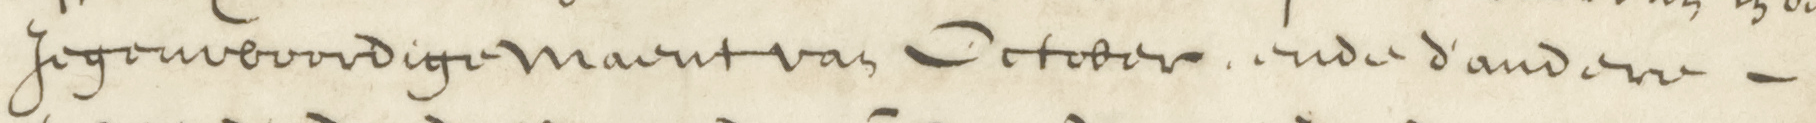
Jegenwoordige maent van October, ende d'andere —
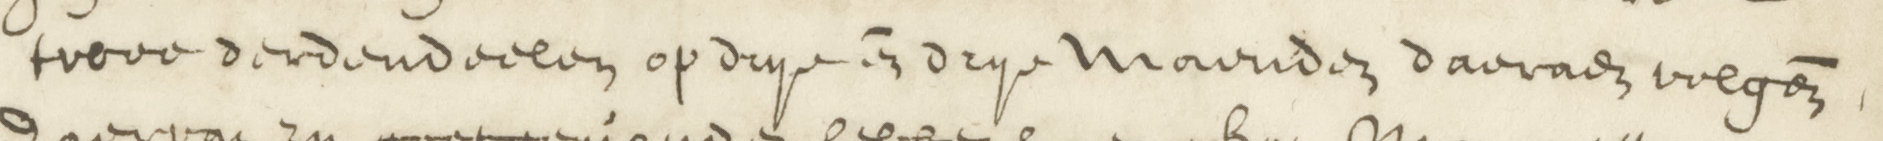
twee derdendeelen op drye en drye maenden daeraen volgen,
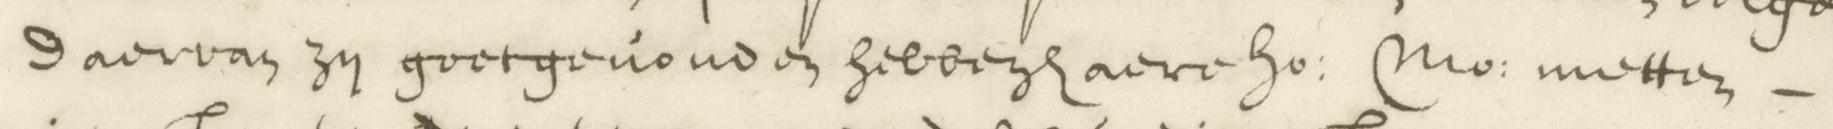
Daervan zy goetgeuonden hebben haere ho:Mo: metten —
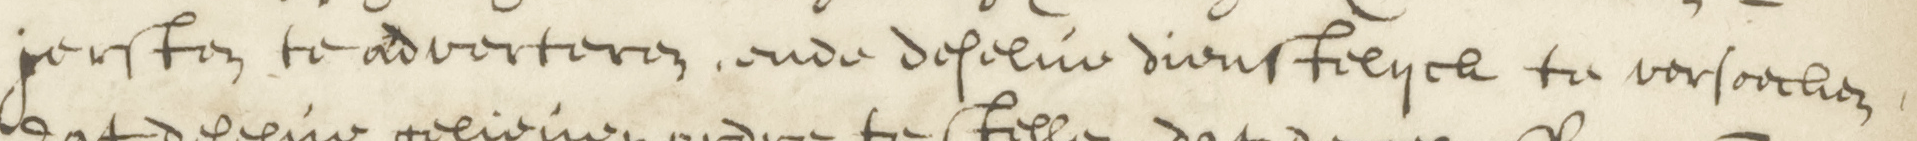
jersten te adverteren, ende deselue dienstelyck te versoecken
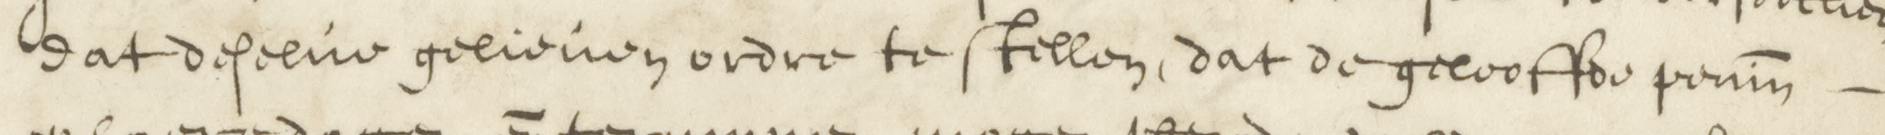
dat deselue gelieuen ordre te stellen, dat de gelooffde penin -
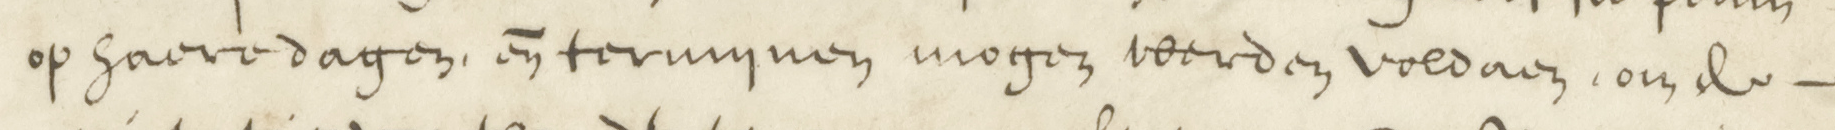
op haere dagen, en termynen mogen werden voldaen, om de
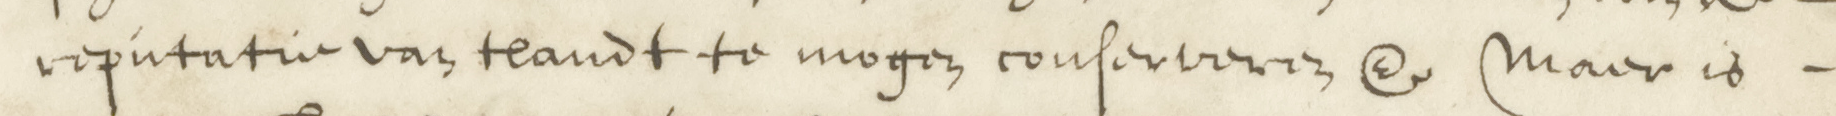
reputatie van tlandt te mogen conserveren @ maer is —
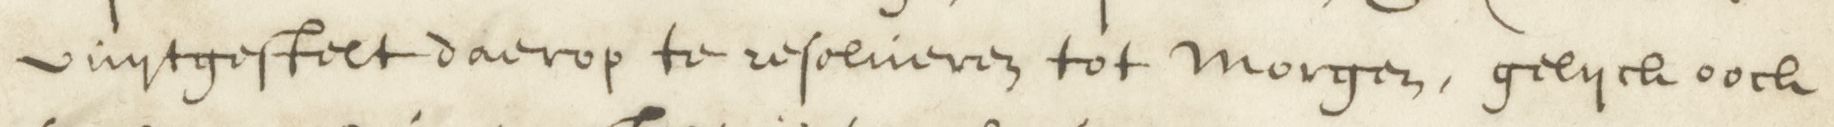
vuytgestelt daerop te resolueren tot morgen, gelyck oock
